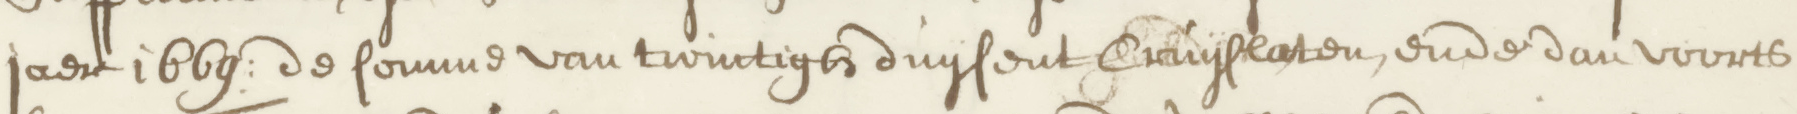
jaer 1669: de somme van twintigh duijsent Cruijslaten, ende dan voorts
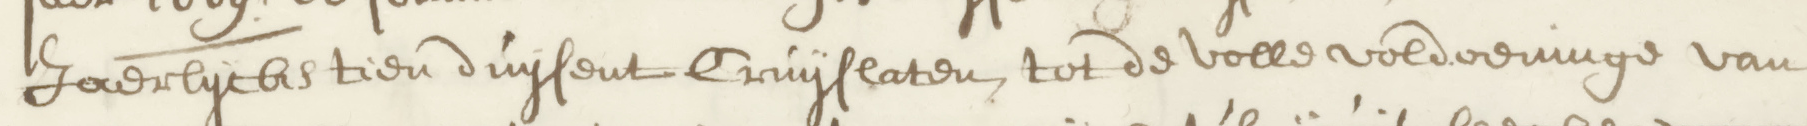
Jaerlijcks tien duijsent Cruijslaten, tot de volle voldoeninge van
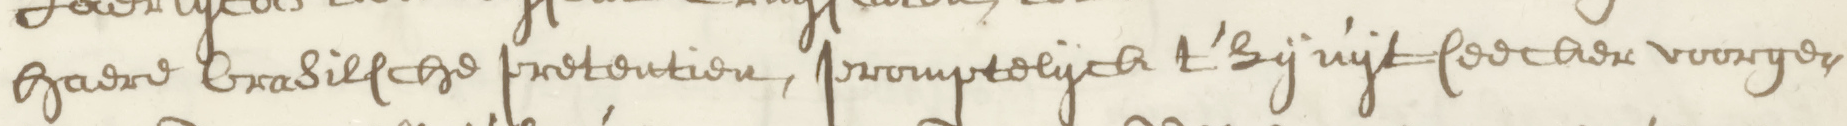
haere Brasilsche pretentien, promptelijck t' zij uijt seecker voorge„
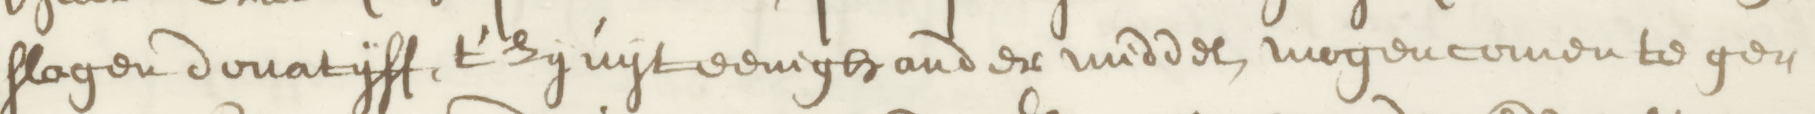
slagen donatijff, t'zij uijt eenigh ander middel mogen comen te ge„
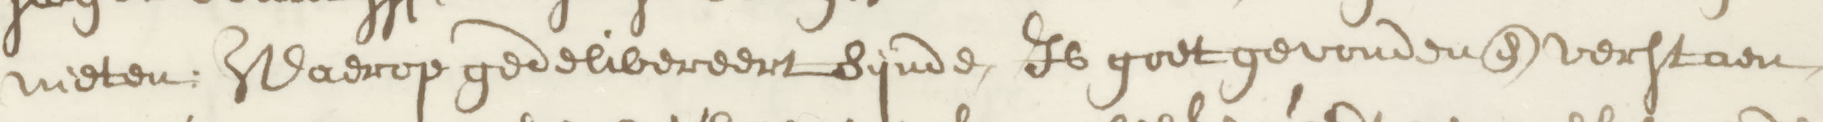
nieten: Waerop gedelibereert sijnde, Is goetgevonden & verstaen,
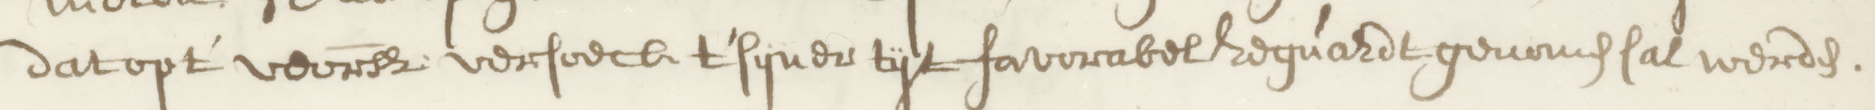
dat opt' voors. versoeck t' sijnder tijt favorabel reguardt genomen sal werden.
